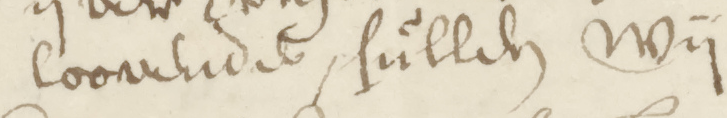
loovende, sullen Wij
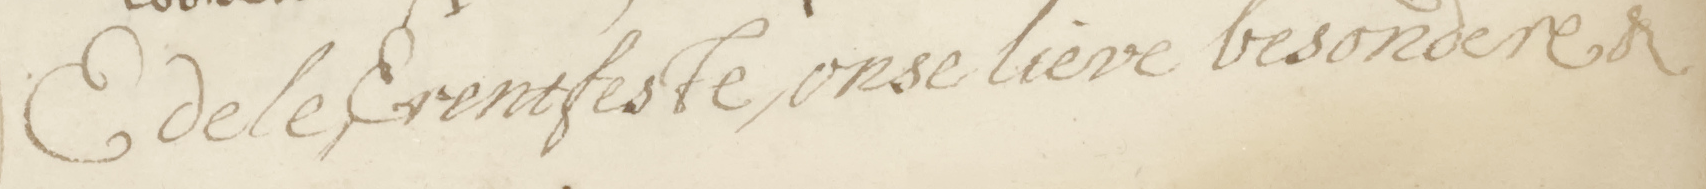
Edele Erentfeste, onse lieve besondere
